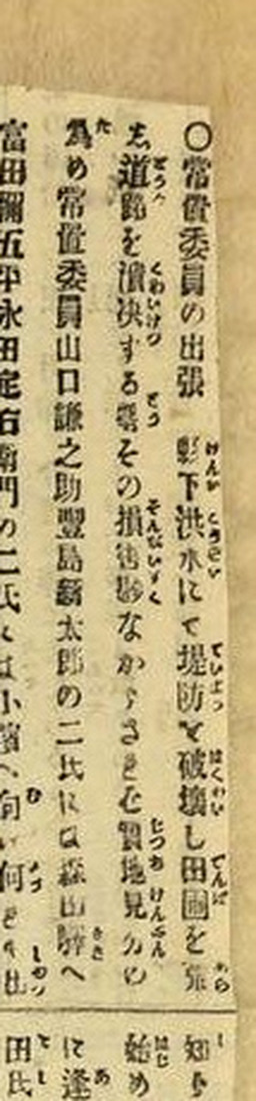し道路を潰决する等の損害尠なからされば實地見分の
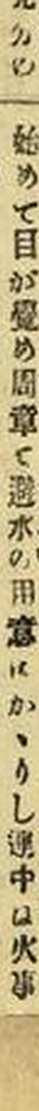始めて目が覺め周章て避水の用意にかゝりし連中は火事
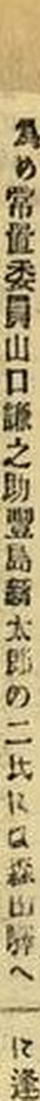爲め常置委員山口謙之助豐島新太郎の二氏には森山驛へ
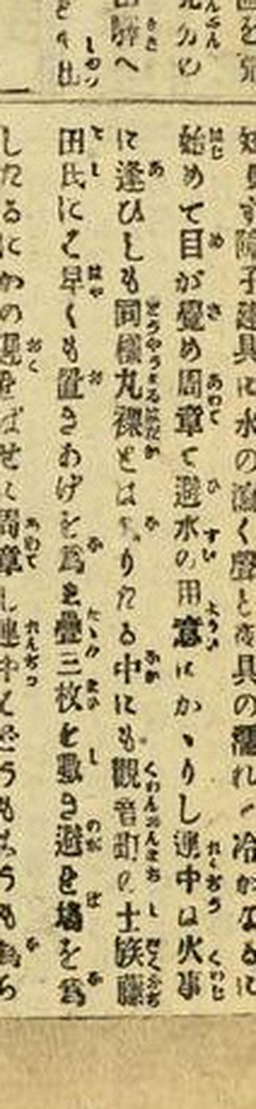に逢ひしも同様丸裸とは爲りたる中にも観音町の士族藤
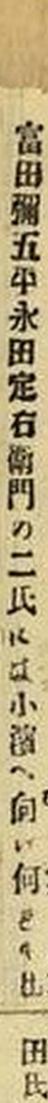富田彌五平永田定右衛門の二氏には小濱へ向い何れも出
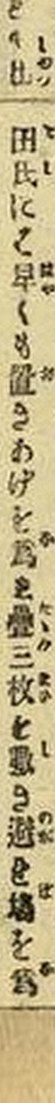田氏には早くも置きあげを爲し疂三枚を敷き避れ塲を爲
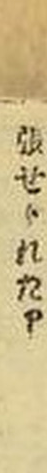張せられたり
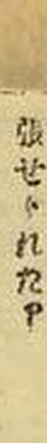張せられたり
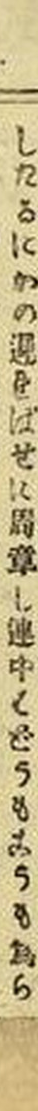したるにかの遅ればせに周章し連中はどうもこうも爲ら
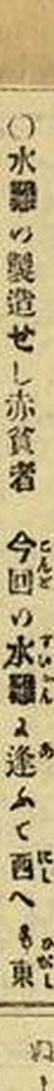○水難の製造せし赤貧者今回の水難に逢ふて西へも東
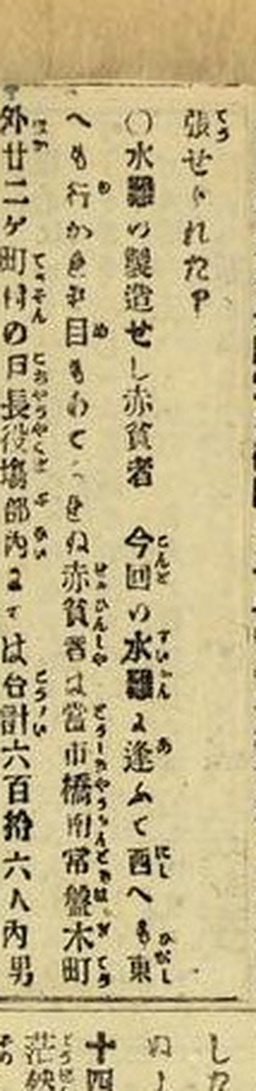○水難の製造せし赤貧者今回の水難に逢ふて西へも東
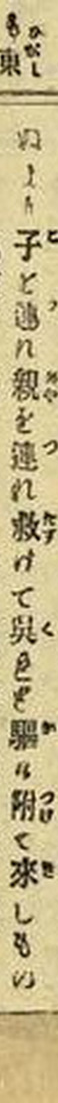ぬより子を連れ親を連れ救けて呉れと驅け附て來しもの
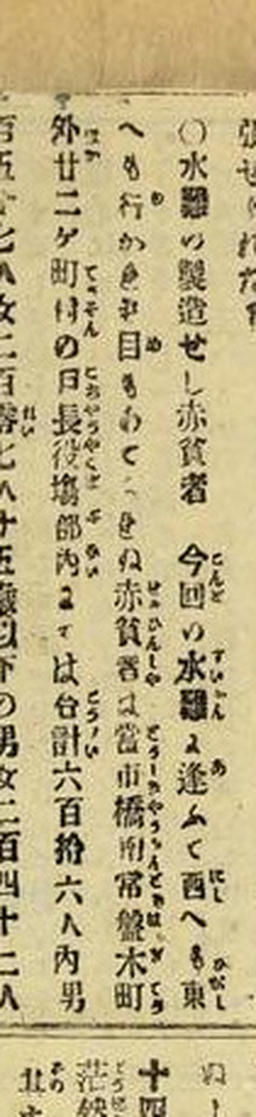へも行かれず目もあてられぬ赤貧者は當市橋南常盤木町
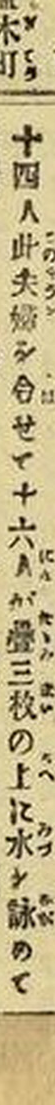十四人此夫婦を合せて十六人が疂三枚の上に水を詠めて
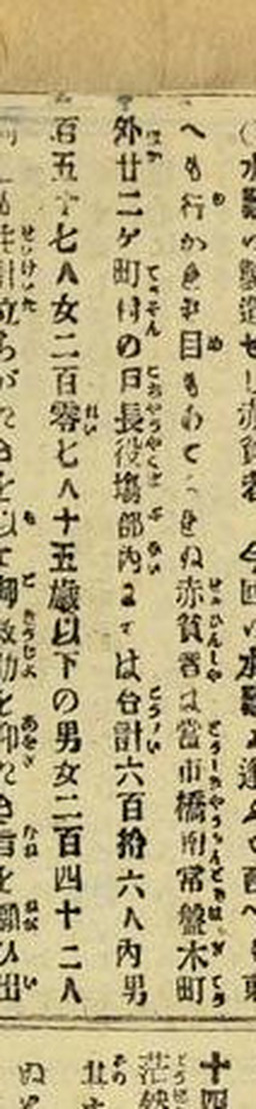外廿二ケ町村の戸長役場部内にては合計六百拾六人内男
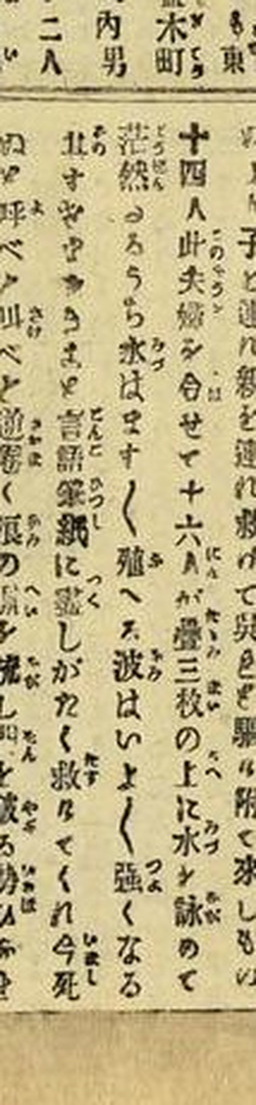茫然たるうち水はます〳〵殖へる波はいよ〳〵强くなる
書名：温古集 五巻
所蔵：福井県文書館 Fukui Prefectural Archives
